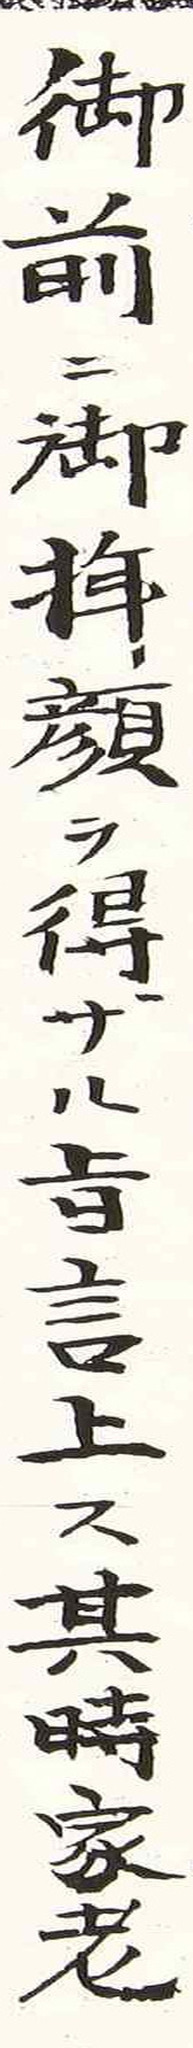御前ニ御拝顔ヲ得ザル旨言上ス其時家老
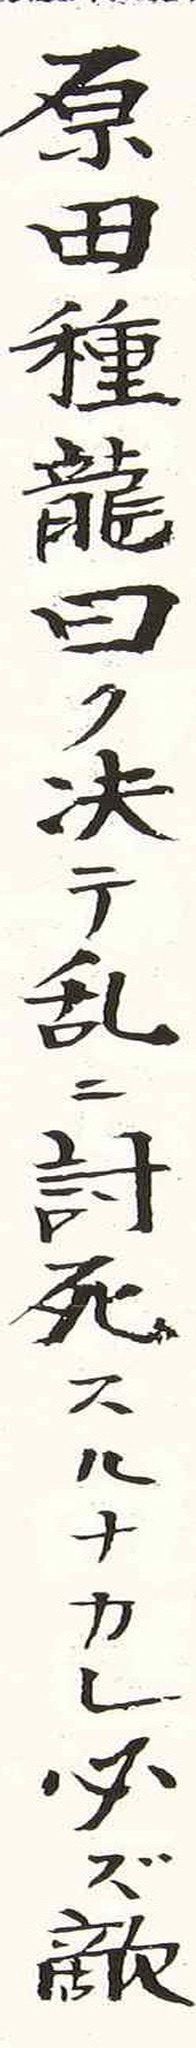原田種竜曰ク決テ乱ニ討死スルナカレ必ズ敵
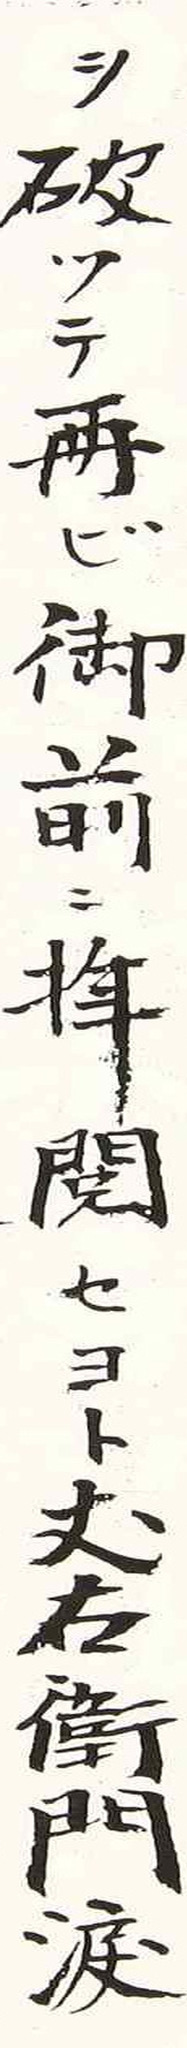ヲ破ツテ再ビ御前ニ拝閲セヨト丈右衛門涙
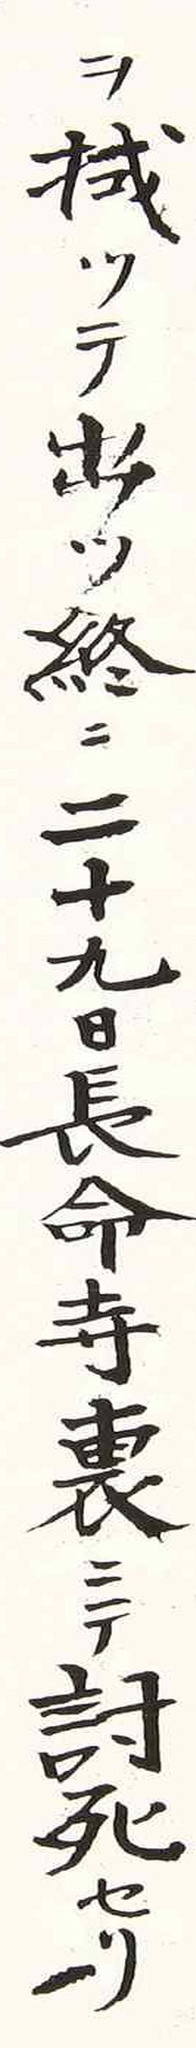ヲ拭ツテ出ツ終ニ二十九日長命寺裏ニテ討死セリ
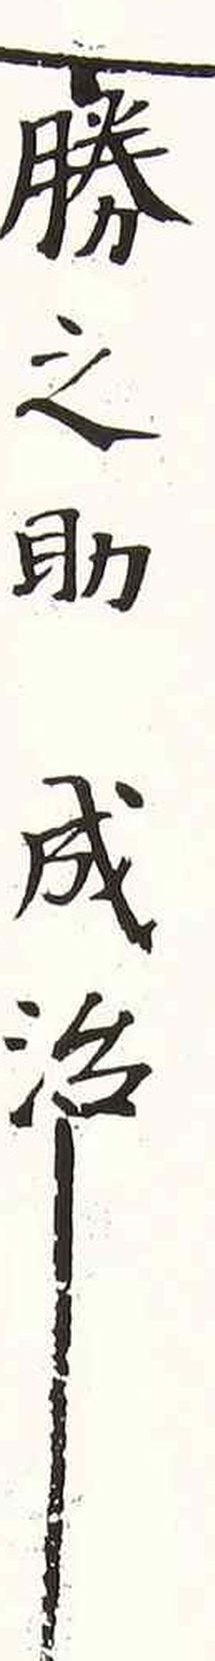勝之助成治
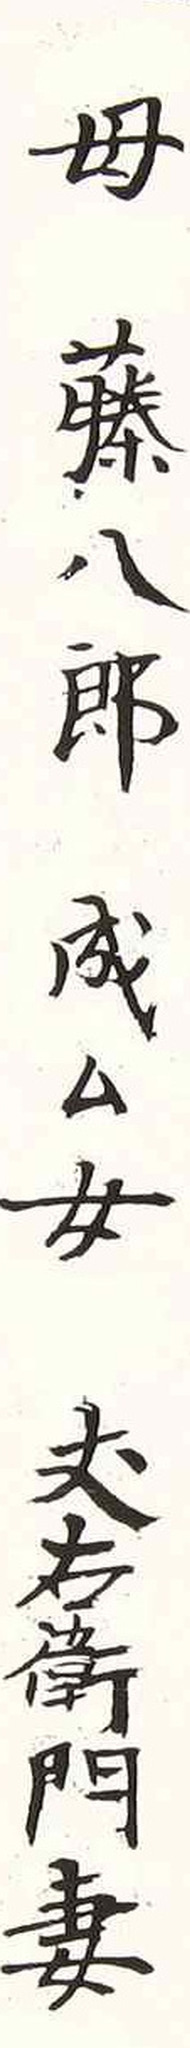母藤八郎成△女丈右衛門妻
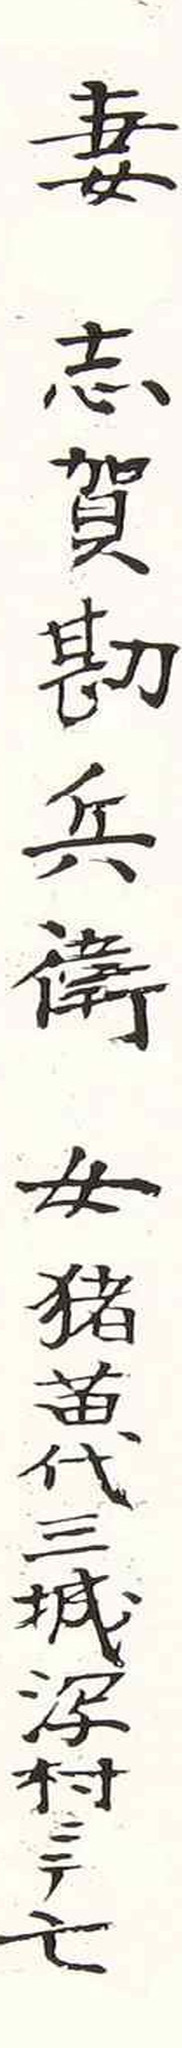妻志賀勘兵衛女猪苗代三城潟村ニテ亡
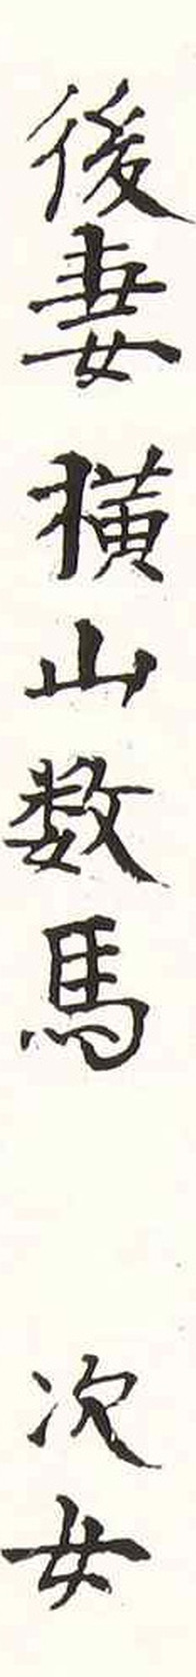後妻横山数馬次女
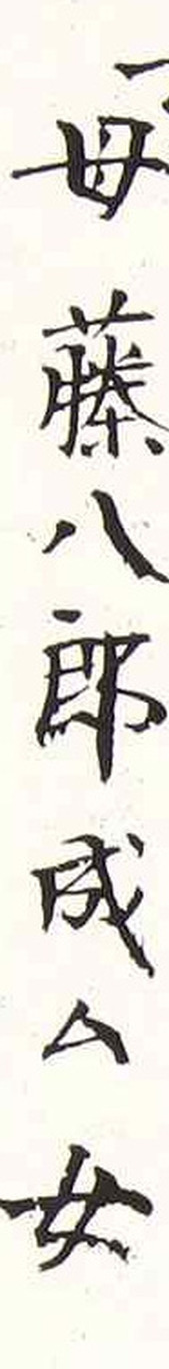母藤八郎成△女
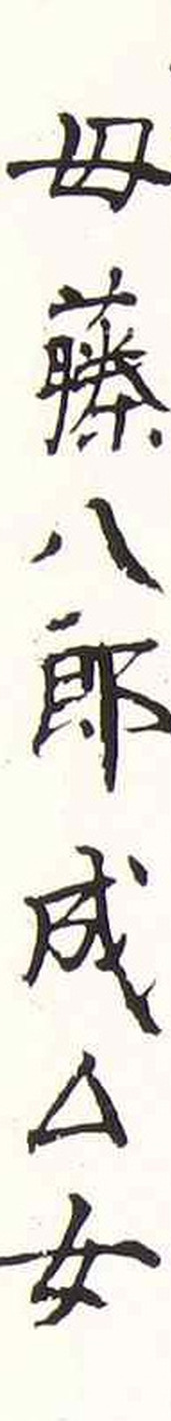母藤八郎成△女
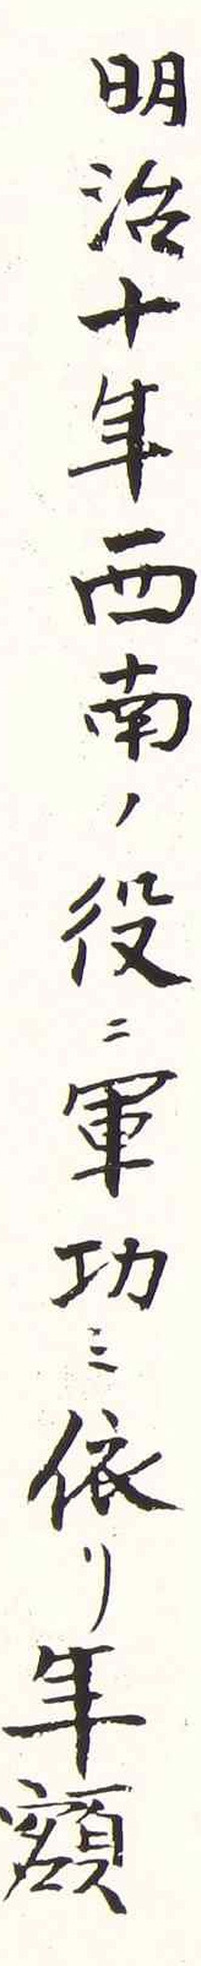明路十年西南ノ役ニ軍功ニ依リ年額

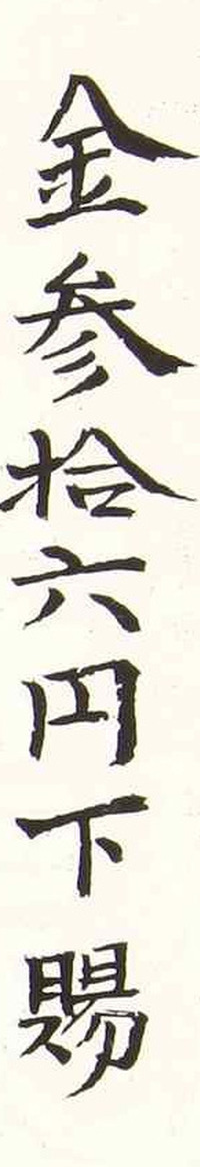金参拾六円下賜
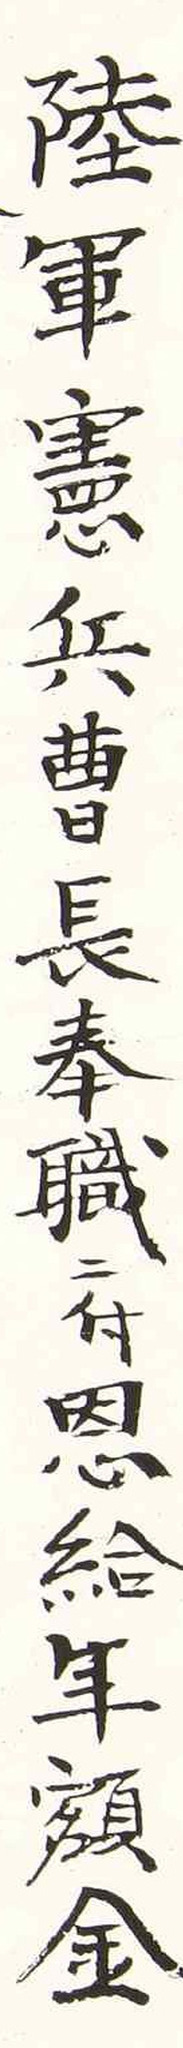陸軍憲兵曹長奉職ニ付恩給年額金
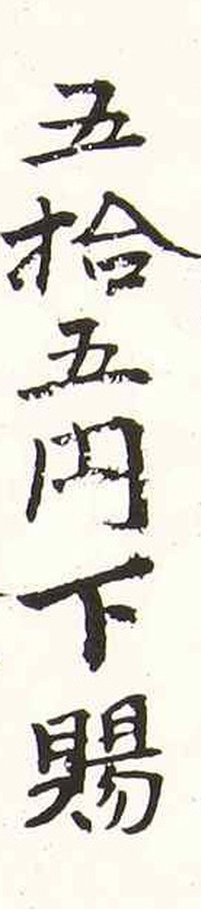五拾円下賜
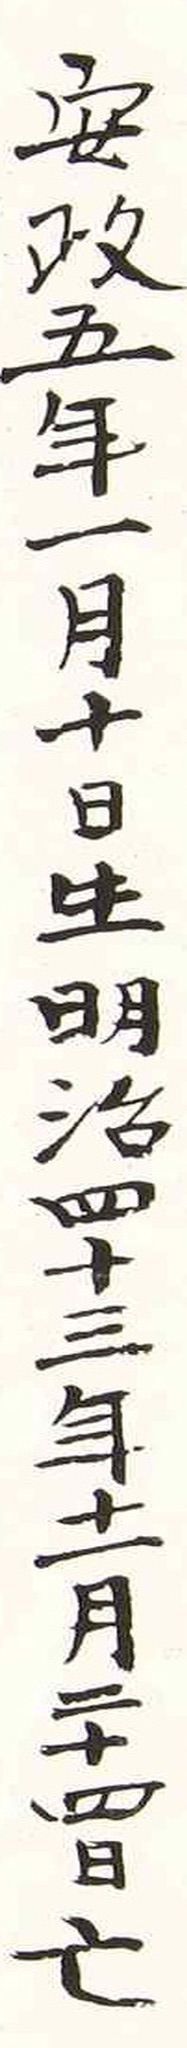安政五年一月十日生明治四十三年十二月二十四日亡
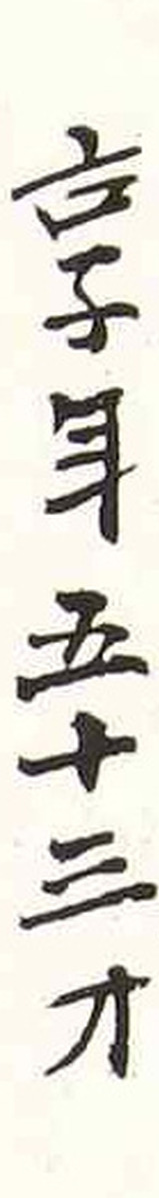享年五十三才
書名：諸士系譜　巻之357　す之部7
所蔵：会津若松市立会津図書館
